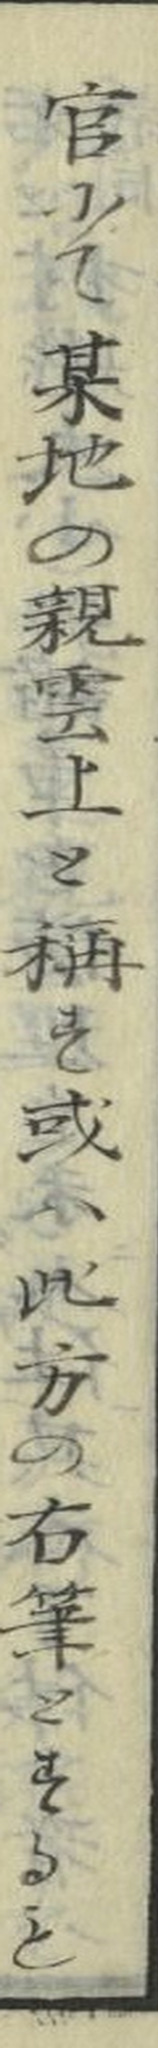官にて某地の親雲上と称す或は此方の右筆とするも
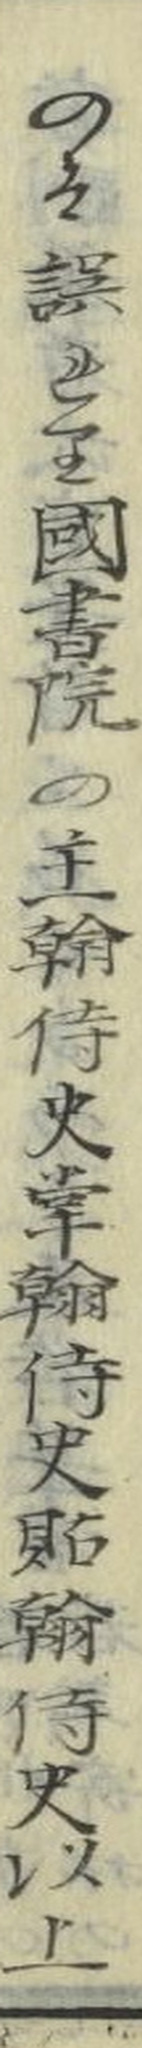のは誤れり国書院の主翰侍史掌翰侍史貼翰侍史以上
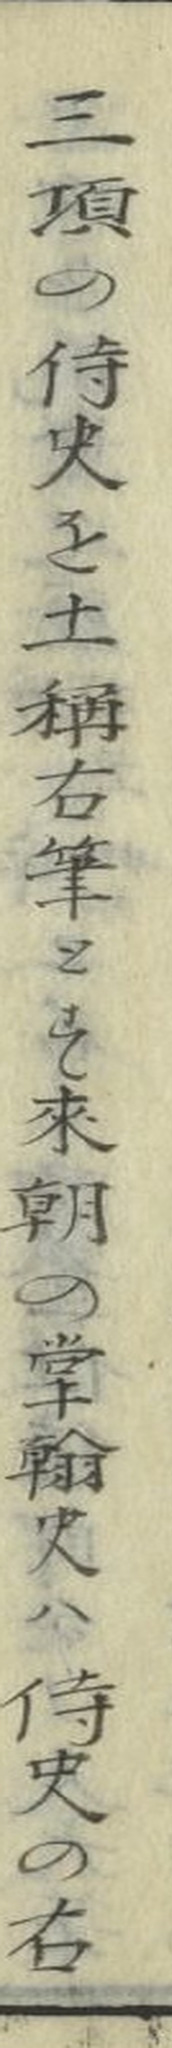三項の侍史を土称右筆とす来朝の掌翰史は侍史の右
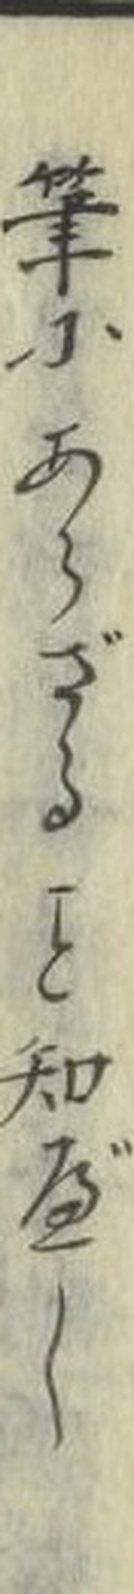筆にあらざること知べし
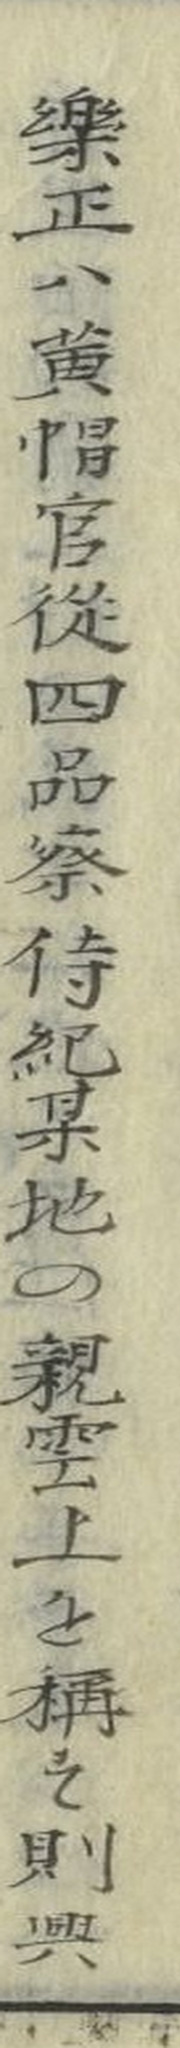楽正は黄帽官従四品察侍紀某地の親雲上を称す則興
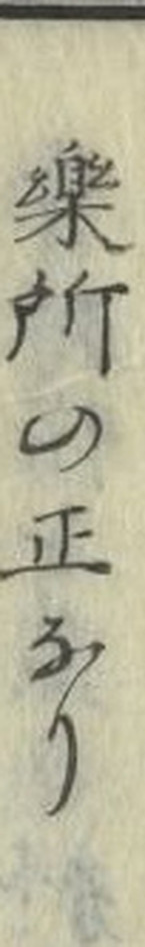楽所の正なり
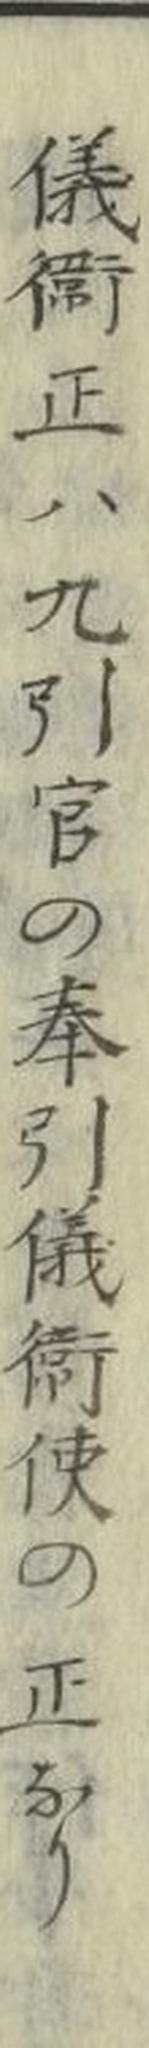儀衛正は九引官の奉引儀衛使の正なり
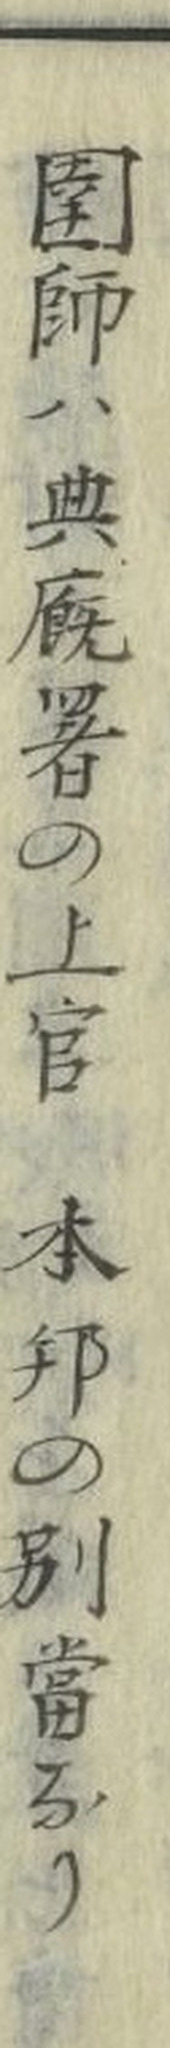圉師は典厩署の上官本邦の別当なり
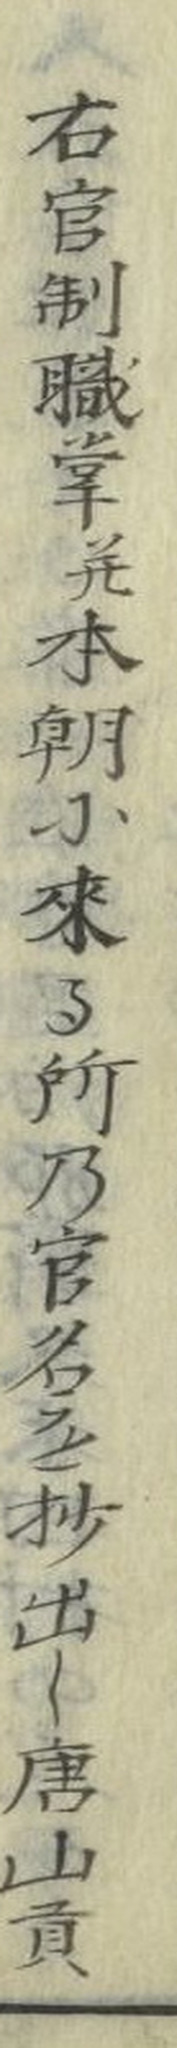右官制職掌并本朝に来る所の官名を抄出し唐山貢
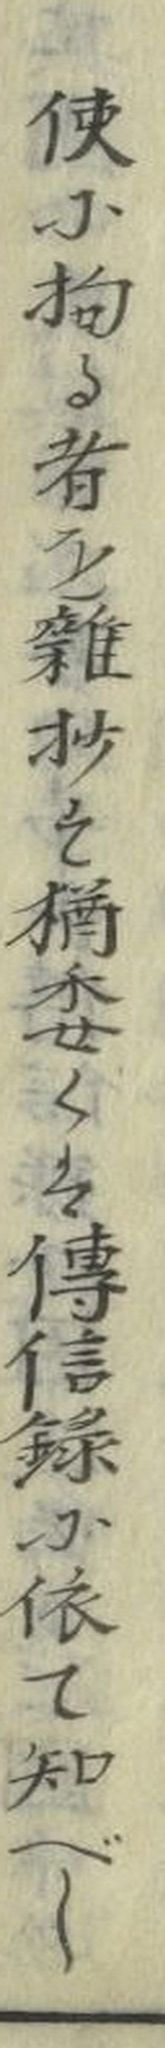使に拘る者を雑抄す猶委くは伝信録に依て知べし

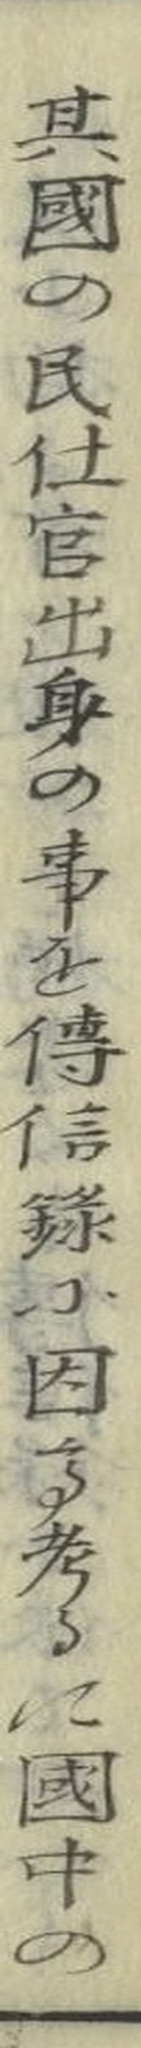其国の民仕官出身の事を伝信録に因て考るに国中の
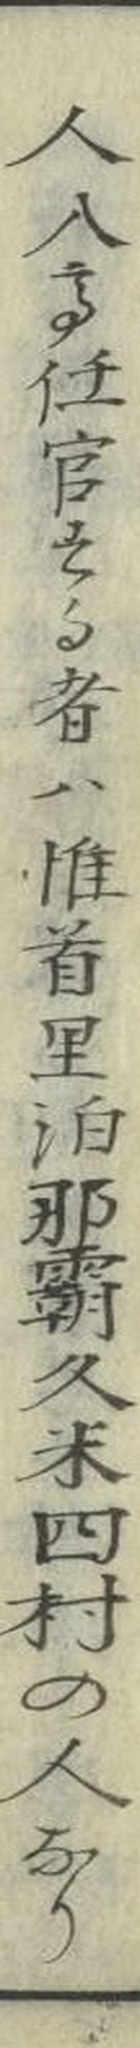人入て任官する者は惟首里泊那覇久米四村の人なり
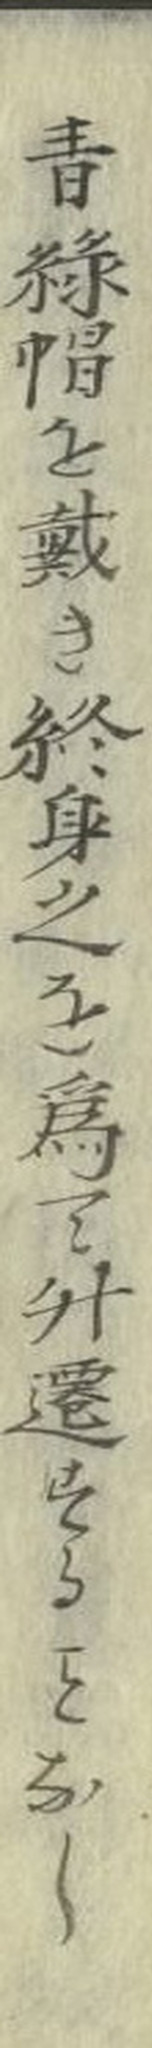青緑帽を戴き終身之を為て升遷することなし
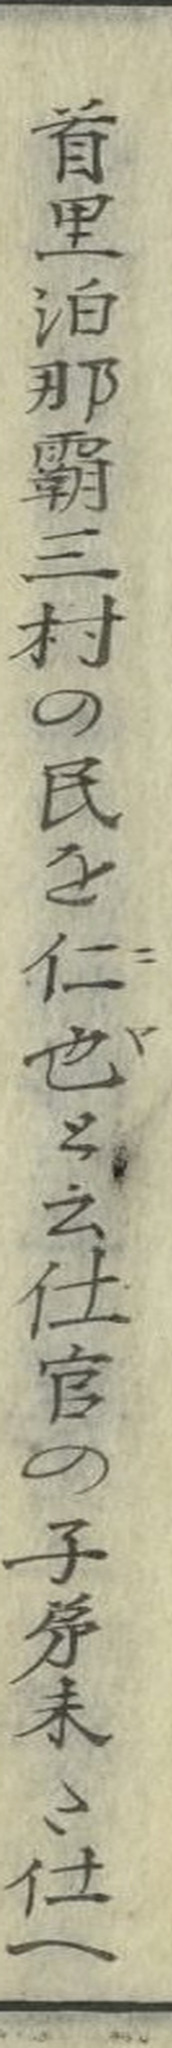首里泊那覇三村の民を仁也と云仕官の子弟未た仕へ
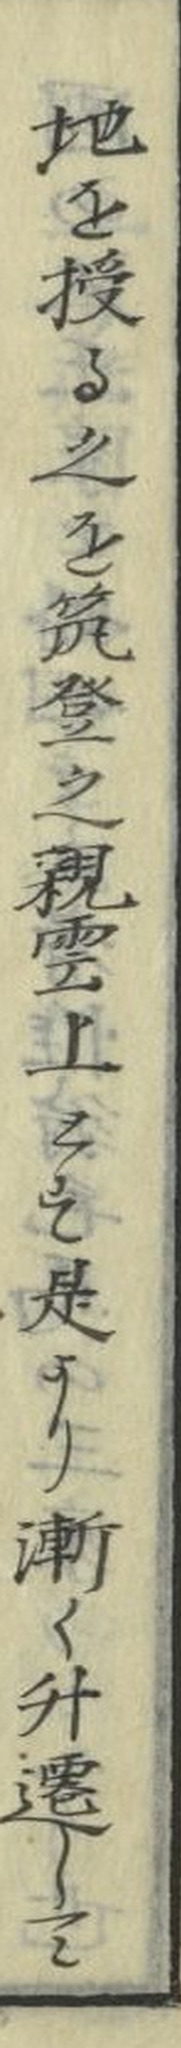地を授る之を筑登之親雲上とす是より漸く升遷して
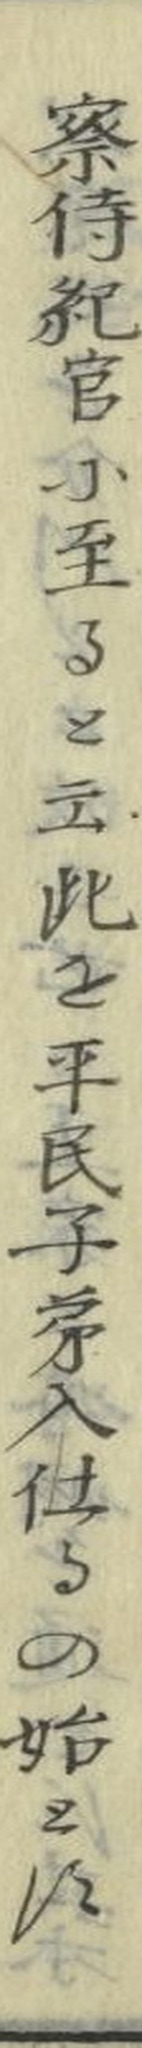察侍紀官に至ると云此を平民子弟入仕るの始とす
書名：琉球沿革志 上
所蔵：University of the Ryukyus Library
